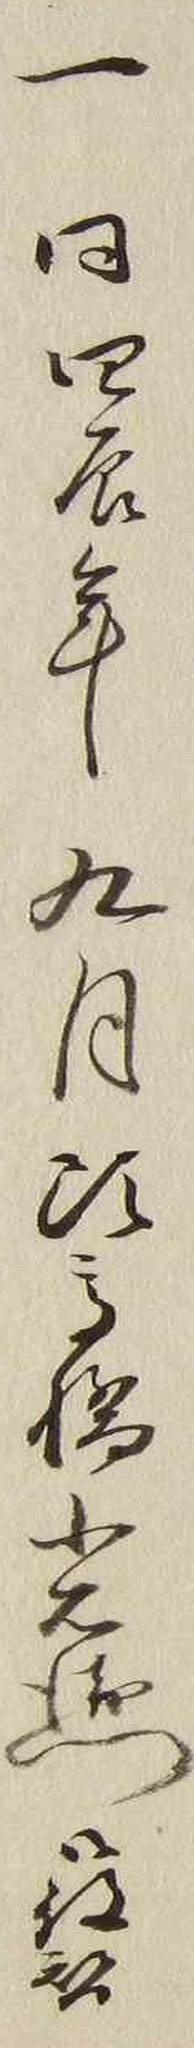一同四辰年九月頃高橋小右衛門御役替え

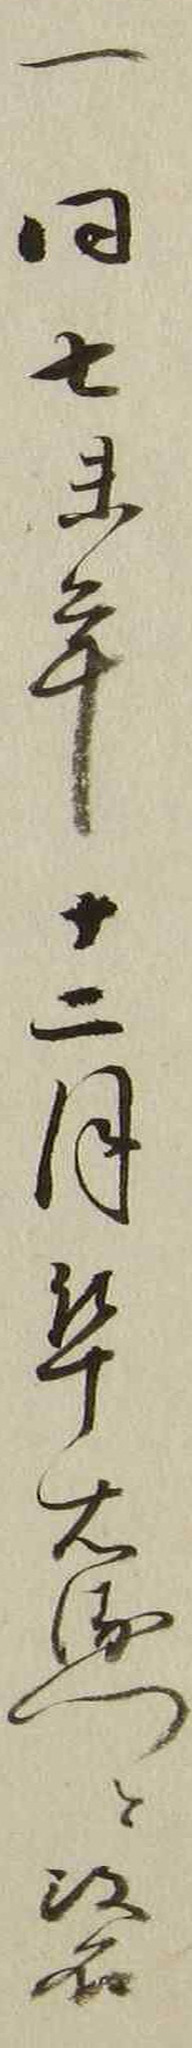一同七未年十二月隼右衛門と改名
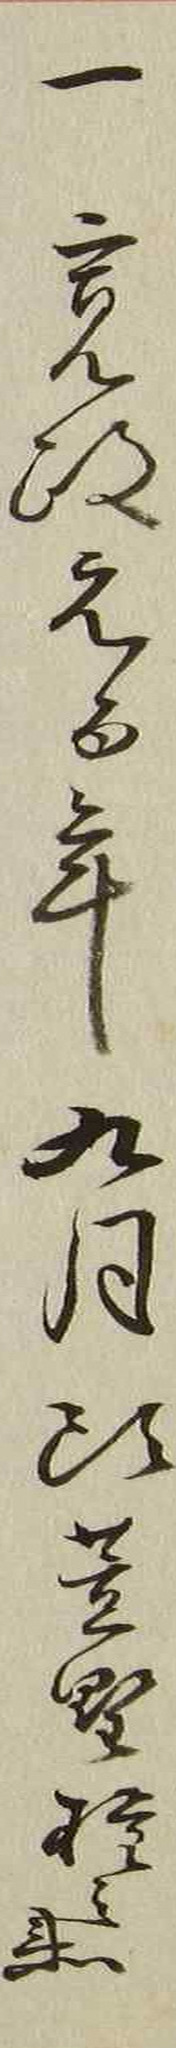一寛政元酉年九月頭菅野権兵衛
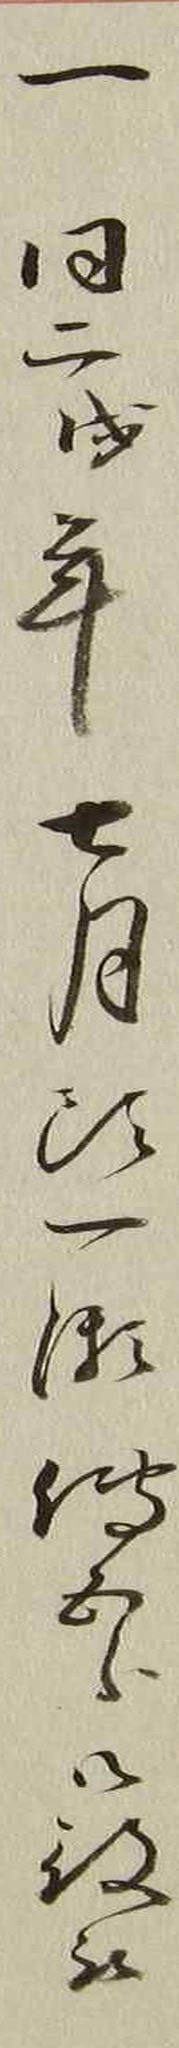一同二戌年七月頭一瀬傳五郎御役
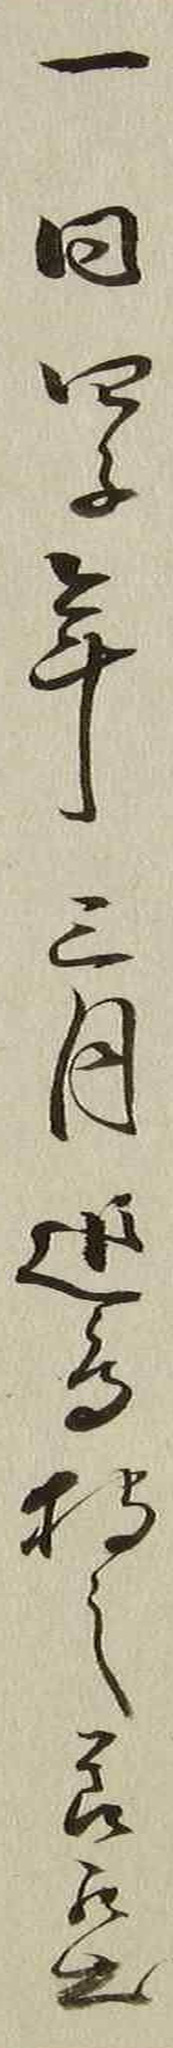一同四子年三月追鳥狩之節召し出
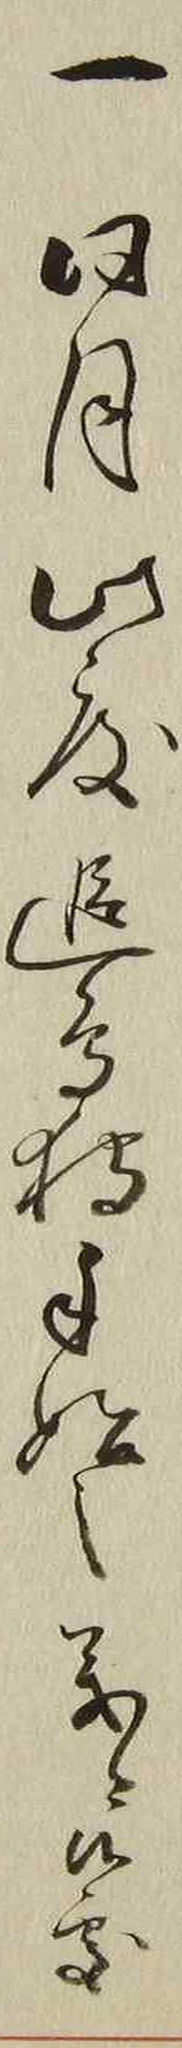一同月此度追鳥狩手始め之義ニ候処
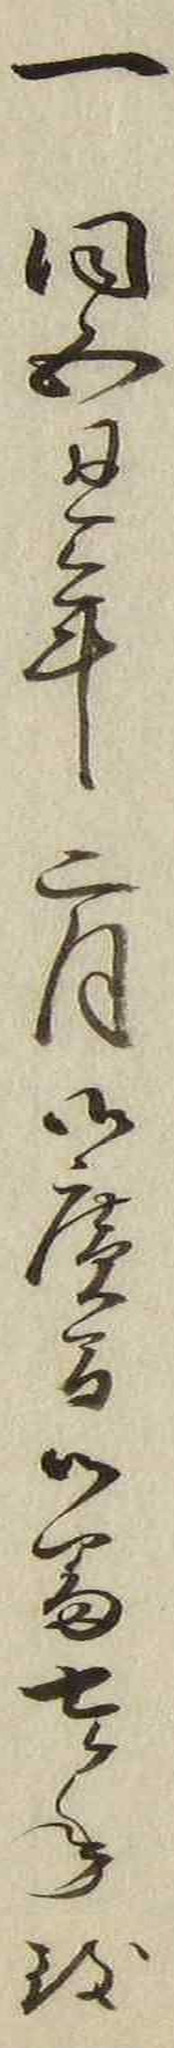一同五丑年二月御広間御番七ケ年

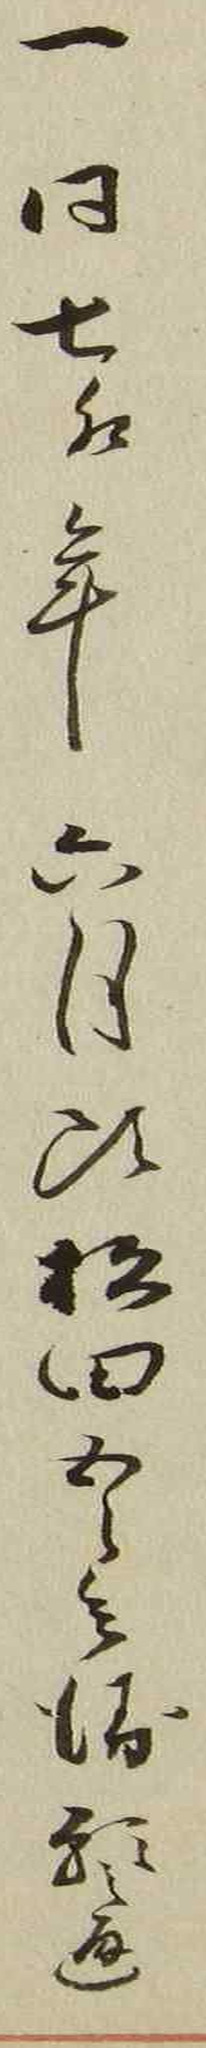一同七卯年六月頃杉田五郎兵衛願い之通り
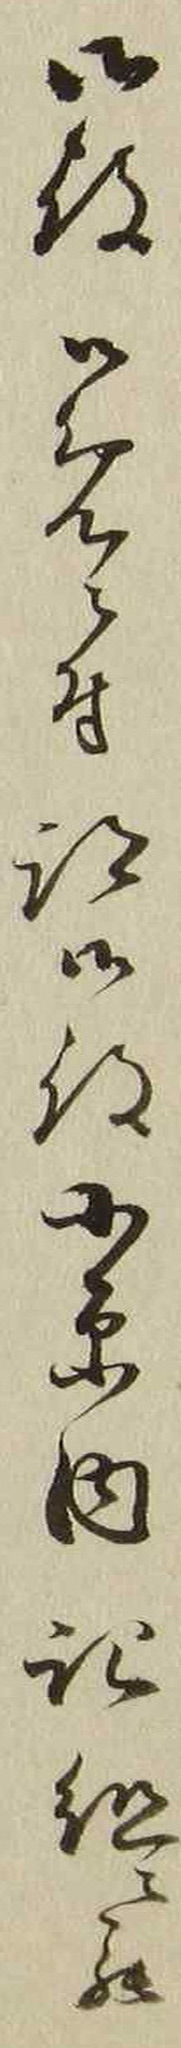御役御免ニ付き跡御役小原内記組ニ罷り
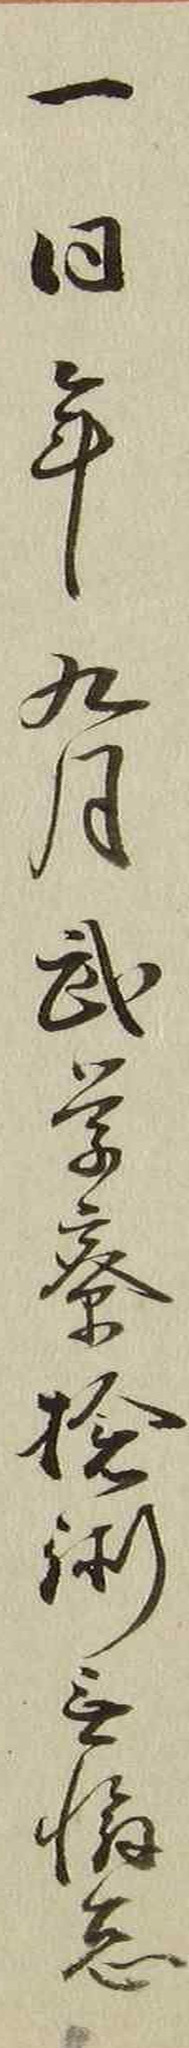一同年九月武学寮槍術懈怠無く
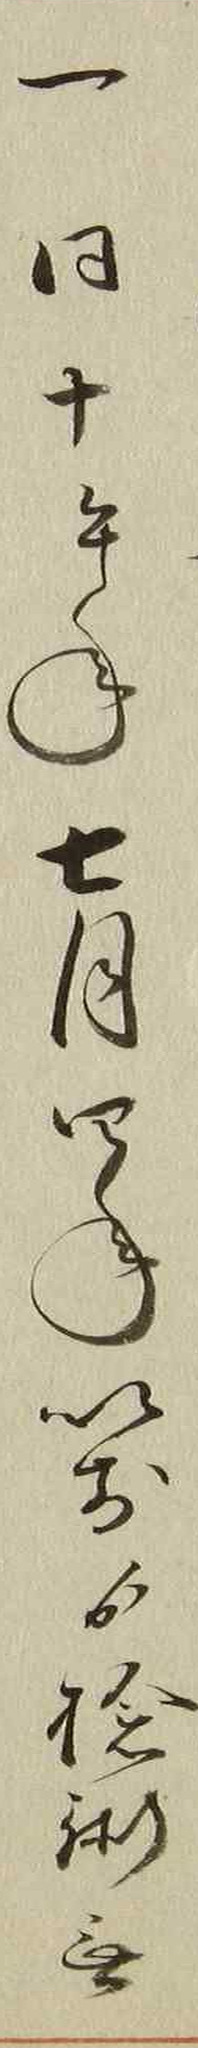一同十午年七月四年以前より槍術
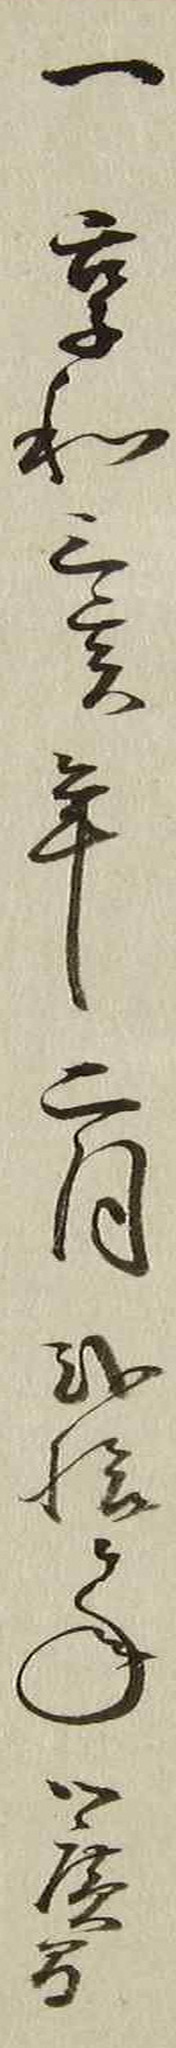一享和三亥年二月弐拾ケ年御広間
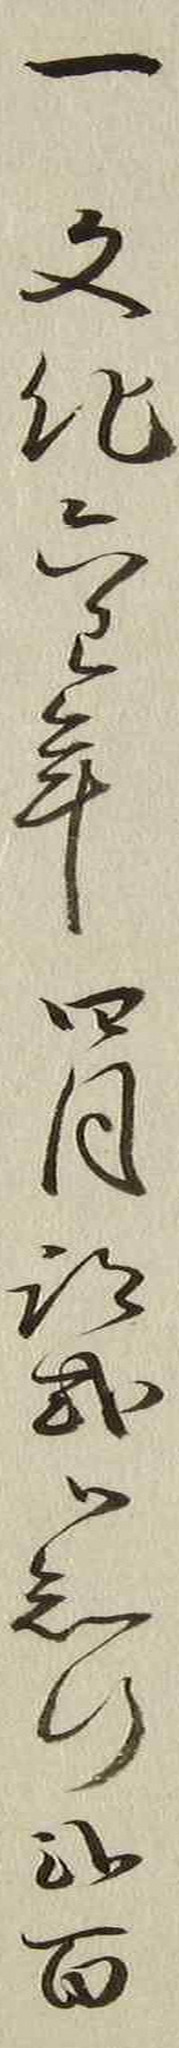一文化六巳年四月跡式御知行弐百
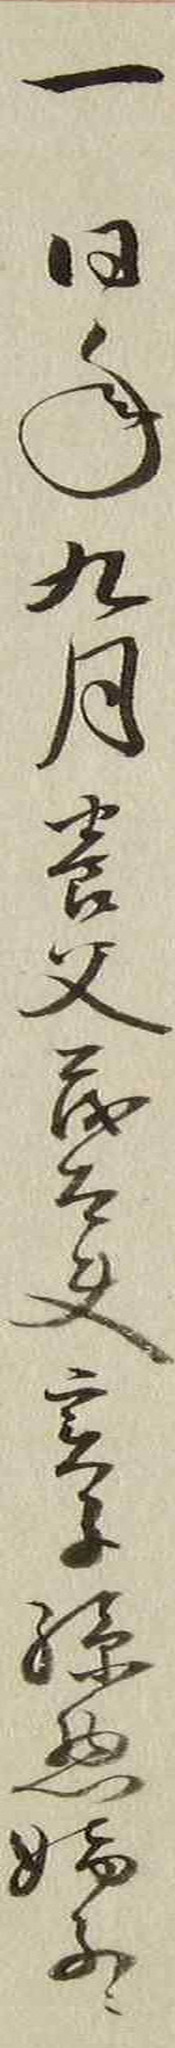一同年九月養父茂太夫実子孫惣嫡子ニ
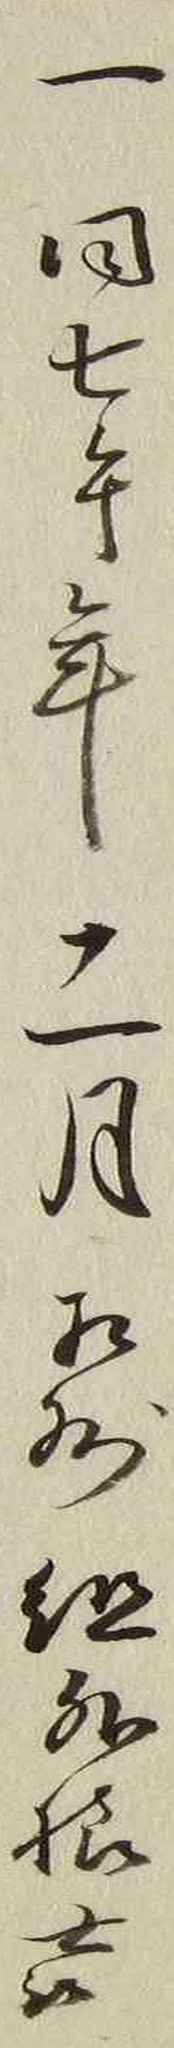一同七午年十一月相州組外様士

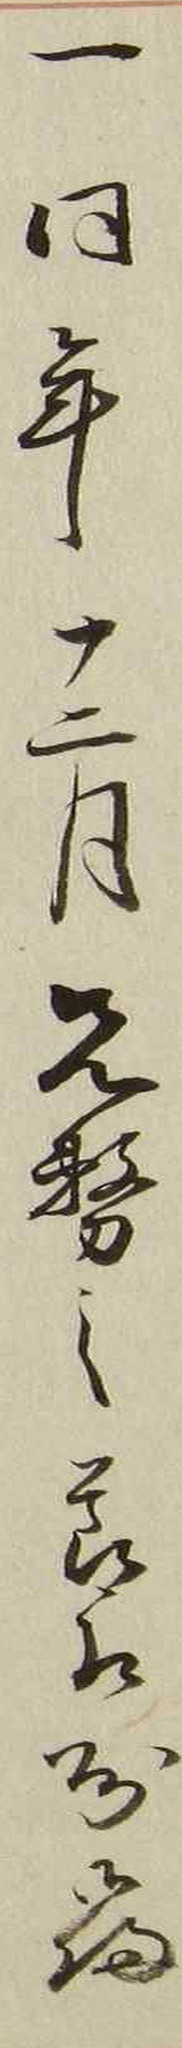一同十二月先務之節相州へ帰
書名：諸士系譜　巻之20　い之部20
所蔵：会津若松市立会津図書館
